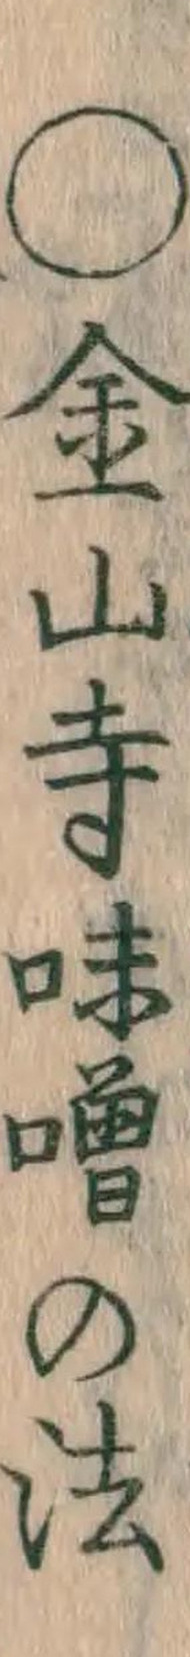○金山寺味噌の法
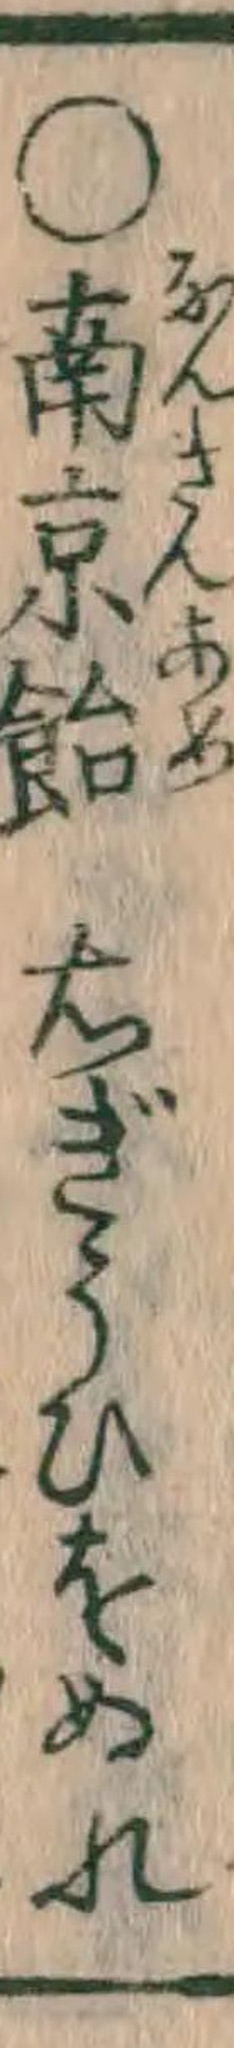○南京飴右ぎうひをぬれ
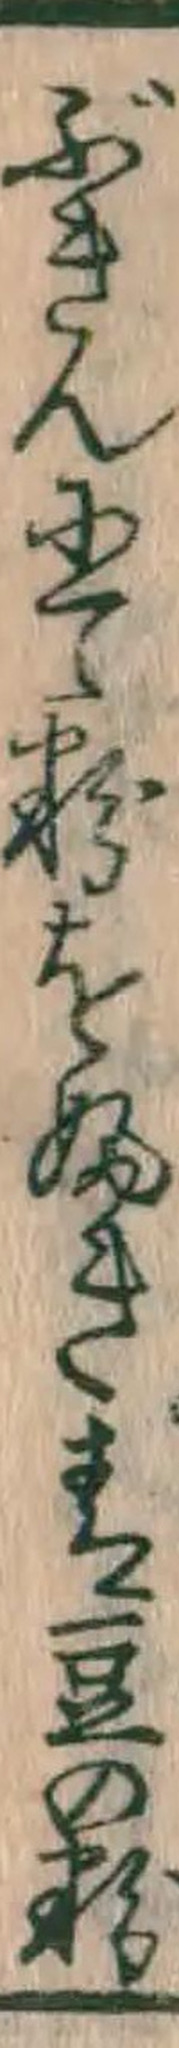ぶきんにて粉をふき青豆の粉
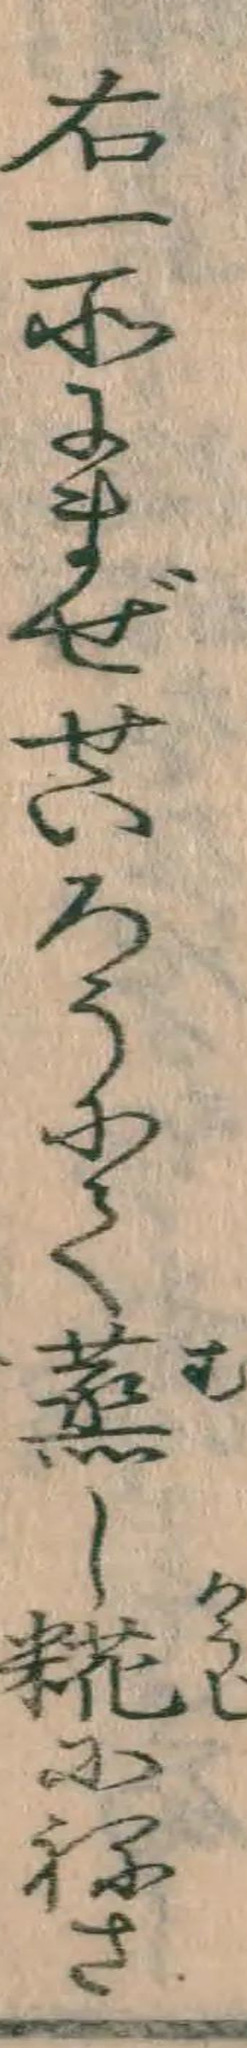右一所にまぜせいろうにて蒸し糀にねさ
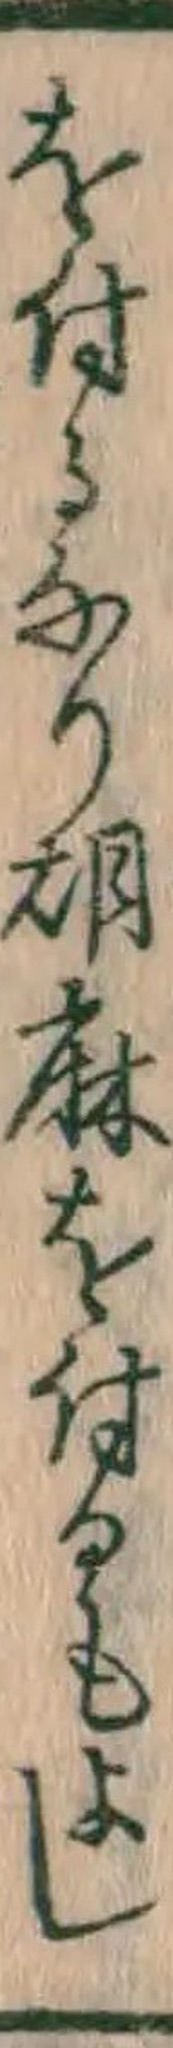を付るなり胡麻を付るもよし
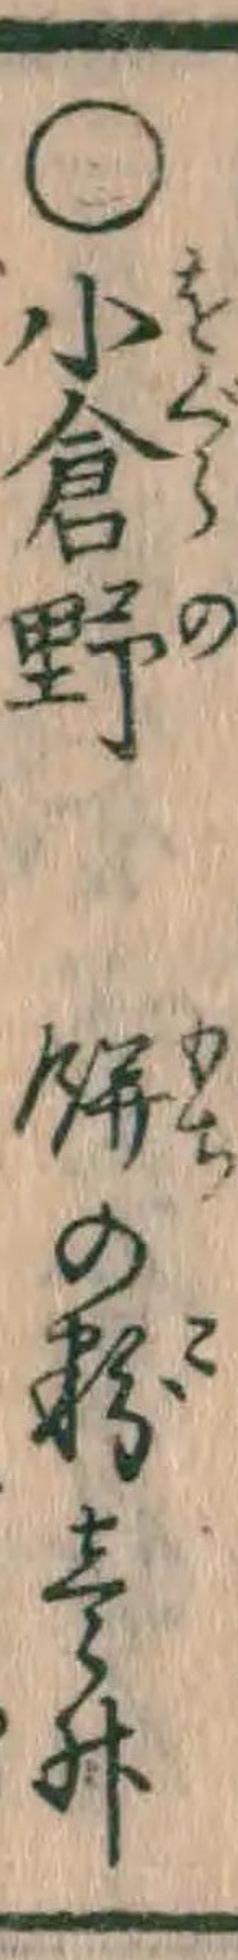○小倉野餅の粉壱升
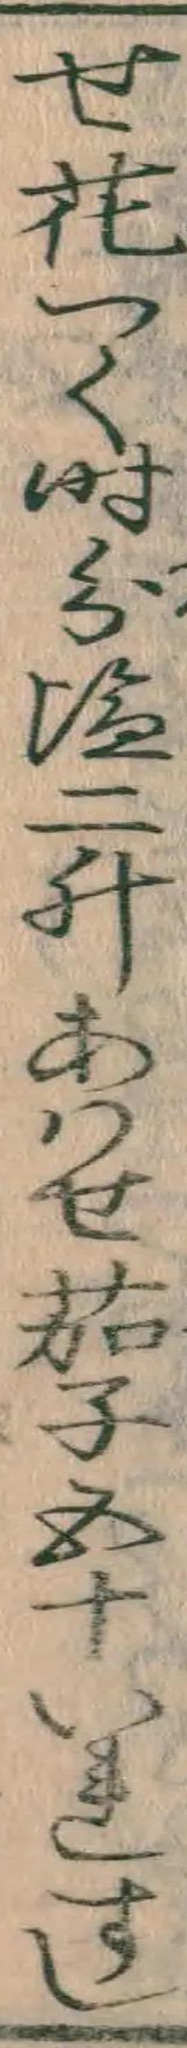せ花つく時分塩二升あはせ茄子五十いれすし
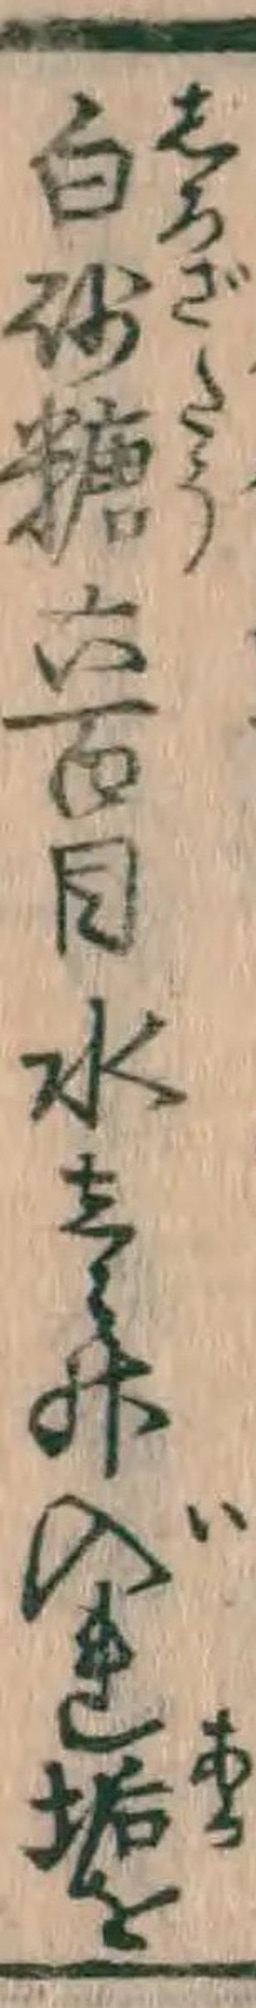白砂糖六百目水壱升入れ垢を
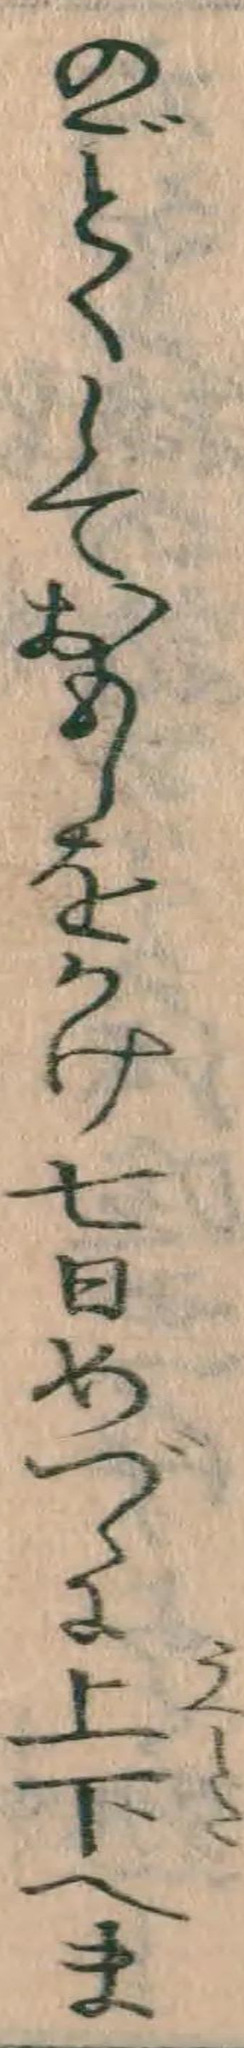のごとくしておもしをかけ七日めづゝに上下へま
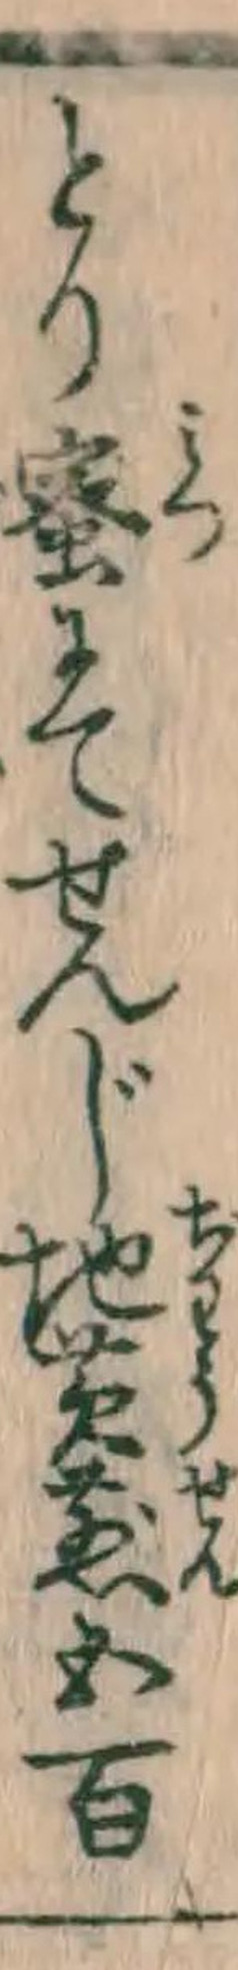とり蜜にてせんじ地黄煎五百
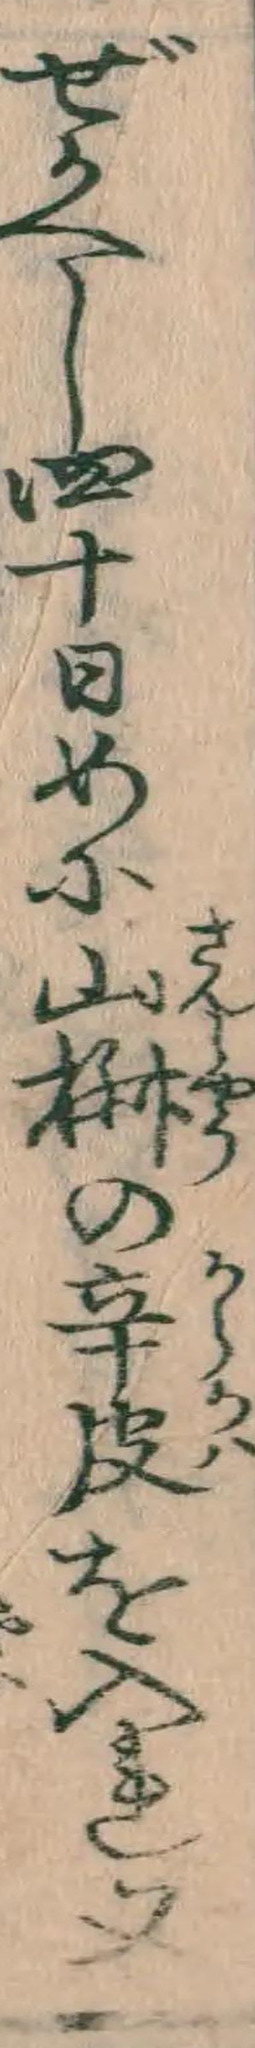ぜかへし四十日めに山桝の辛皮を入れ又
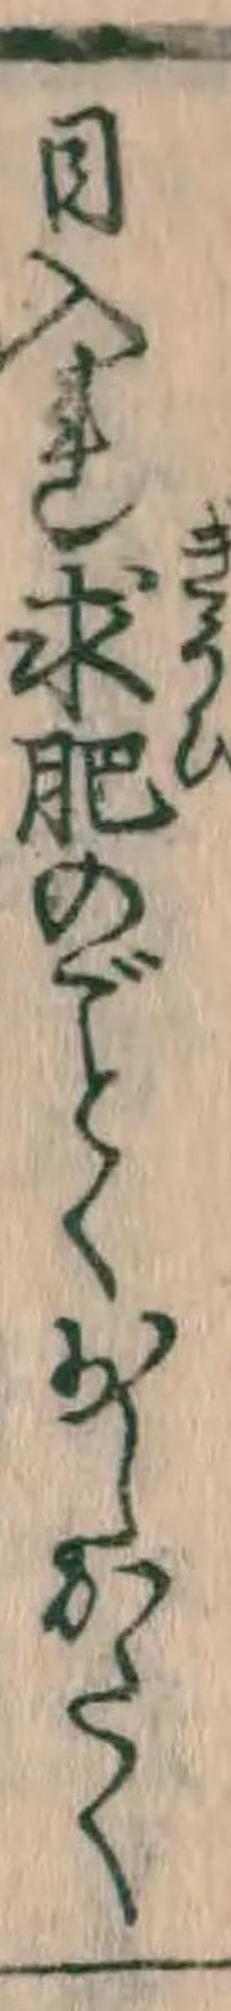目入れ求肥のごとく少しかたく
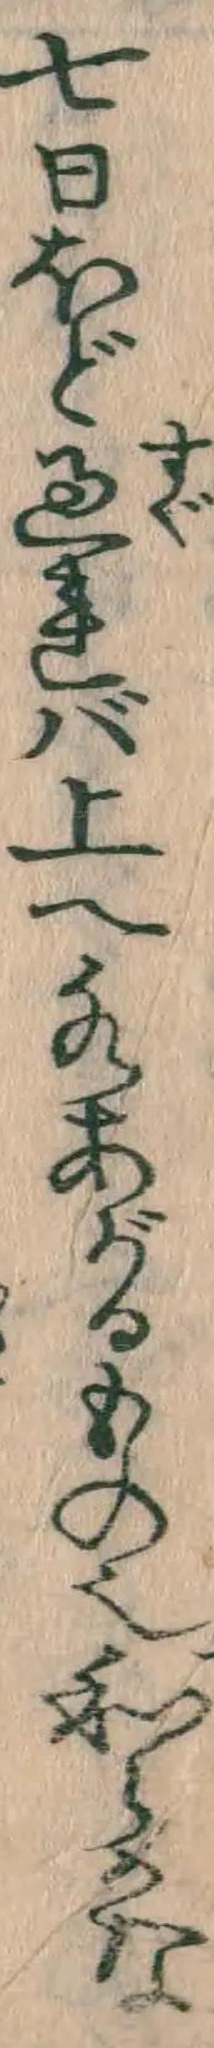七日ほど過れば上へ水あがるもの也和らかな
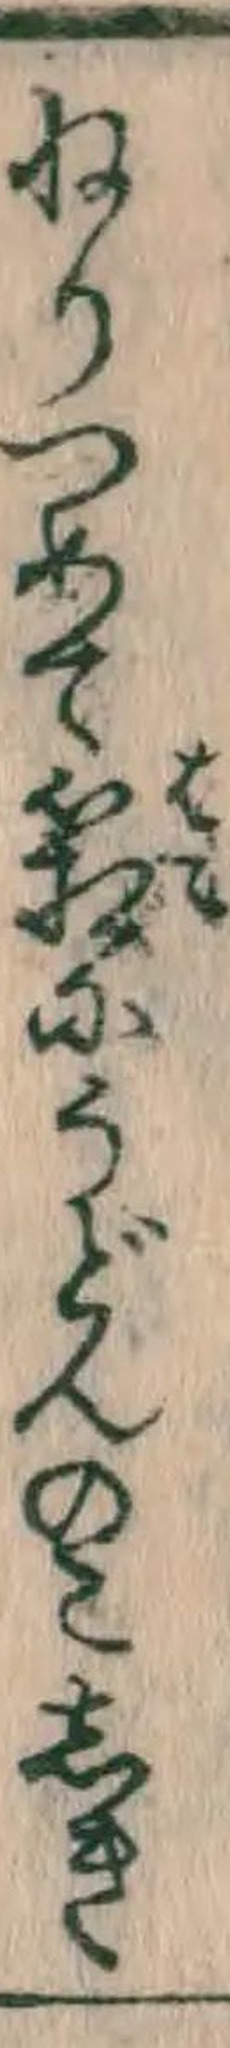ねりつめて箱にうどんのこしき
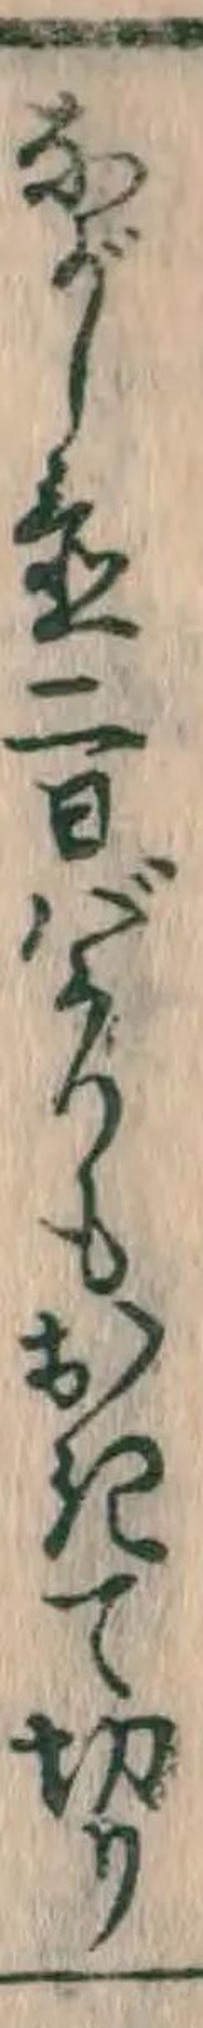ながし置二日ばかりもおきて切り
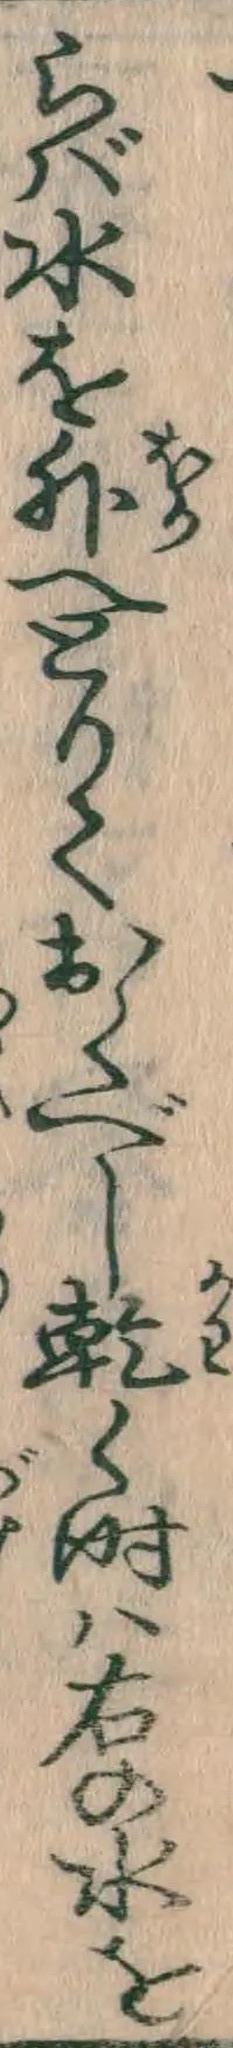らば水を外へとりておくべし乾く時は右の水を
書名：広益秘事大全 3巻. [5]
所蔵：国立国会図書館 National Diet Library, JAPAN
